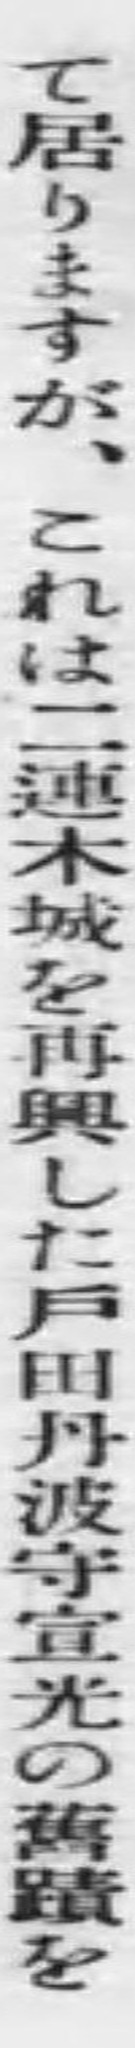て居りますが、これは二連木城を再興した戸田丹波守宣光の旧蹟を
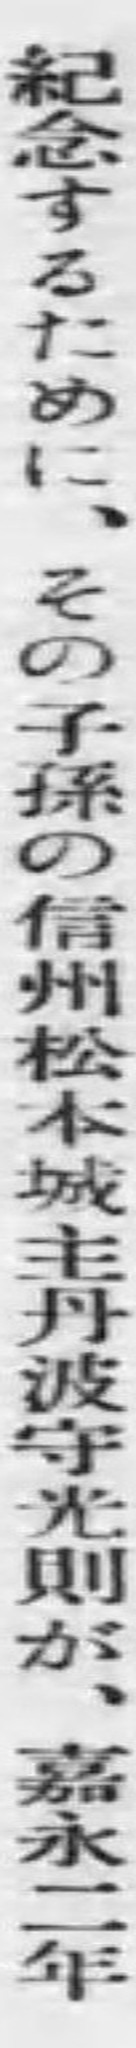紀念するために、その子孫の信州松本城主丹波守光則が、嘉永二年
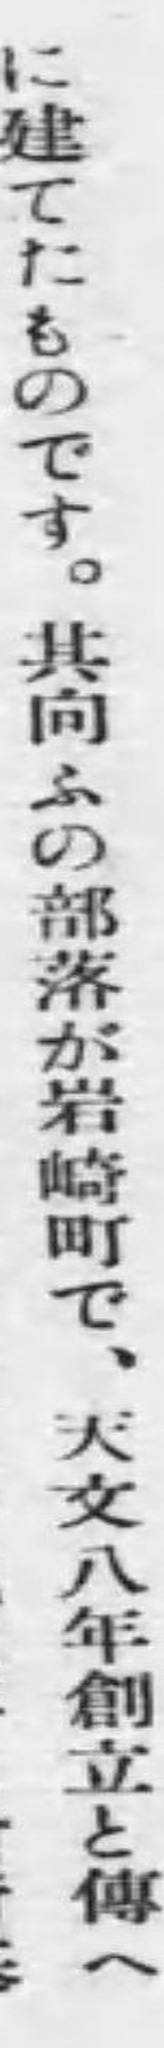に建てたものです。其向ふの部落が岩崎町で、天文八年創立と伝へ
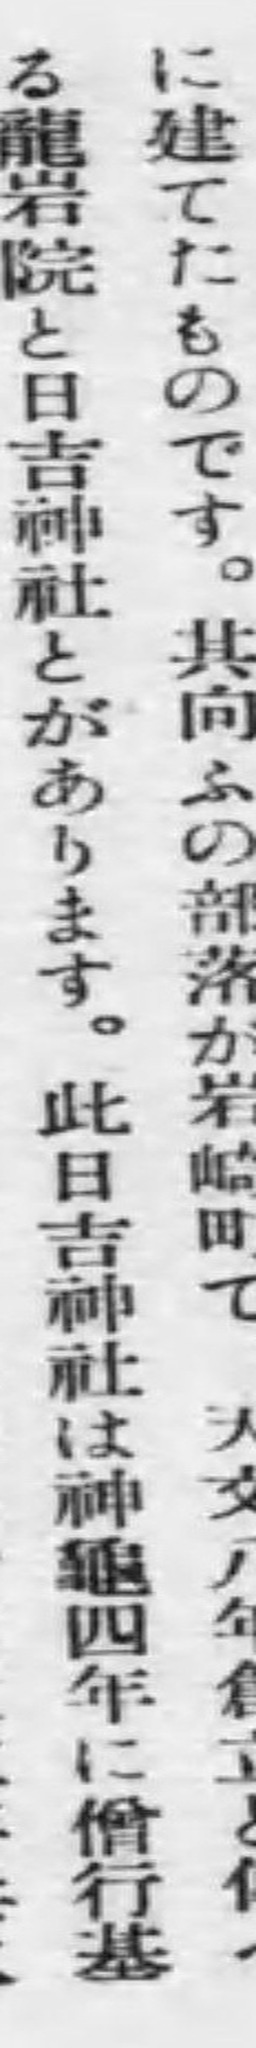る龍岩院と日吉神社とがあります。此日吉神社は神亀四年に僧行基
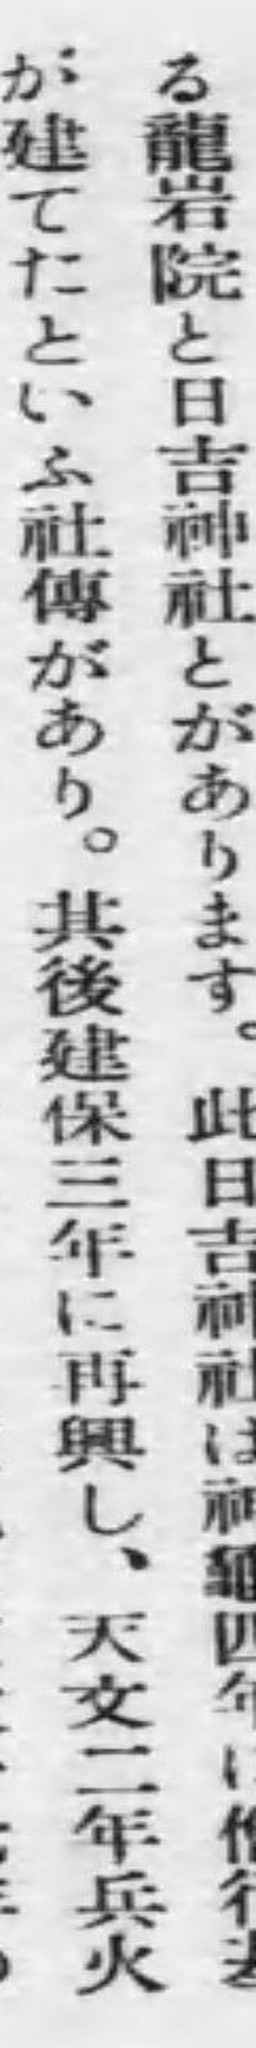が建てたといふ社伝があり。其後建保三年に再興し、天文二年兵火
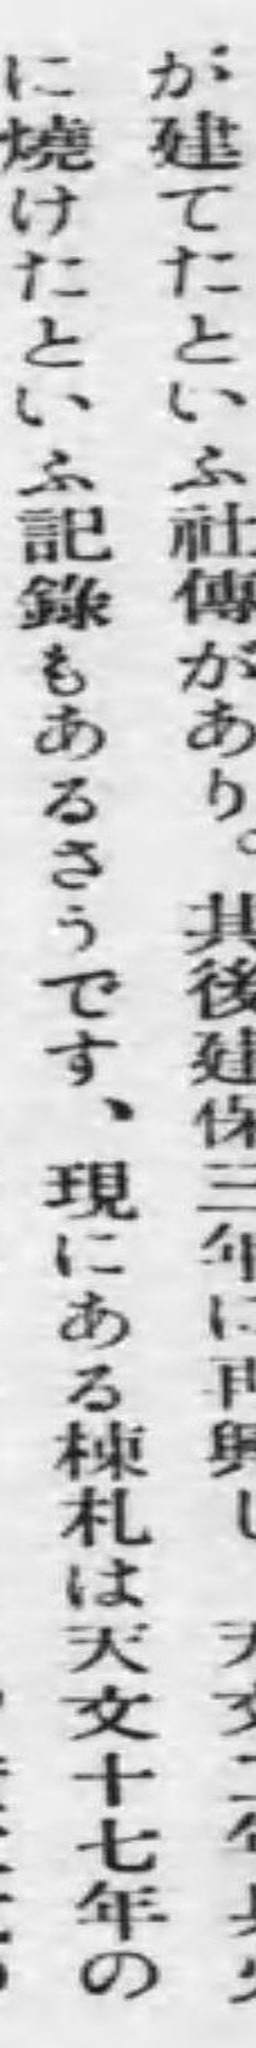に焼けたといふ記録もあるさうです、現にある棟札は天文十七年の
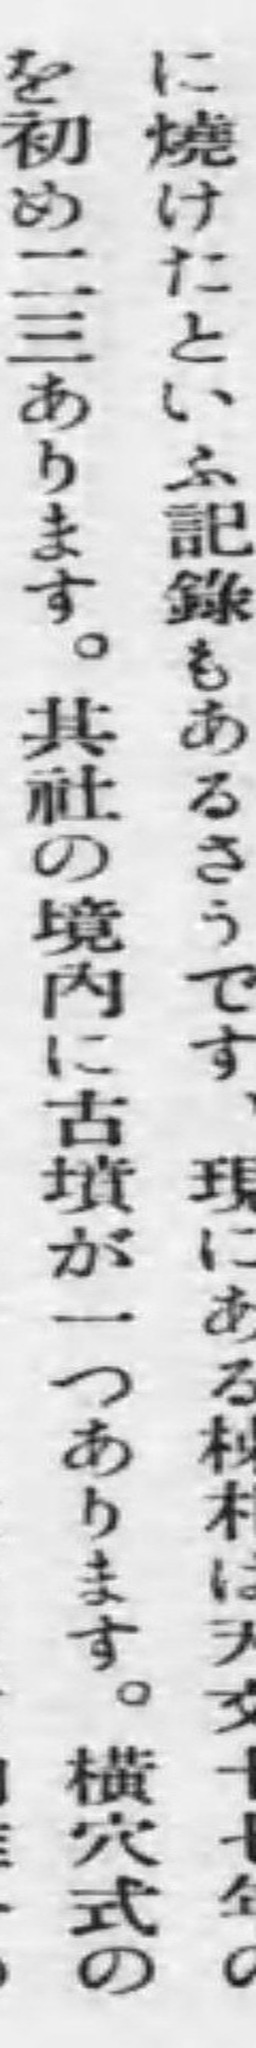を初め二三あります。其社の境内に古墳が一つあります。横穴式の
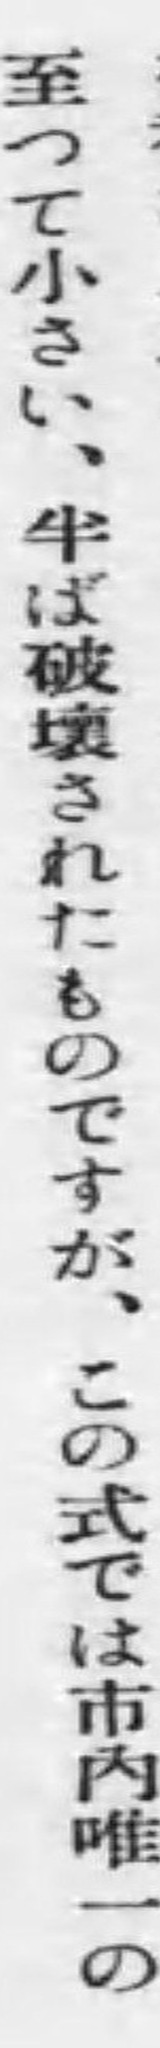至つて小さい、半ば破壊されたものですが、この式では市内唯一の
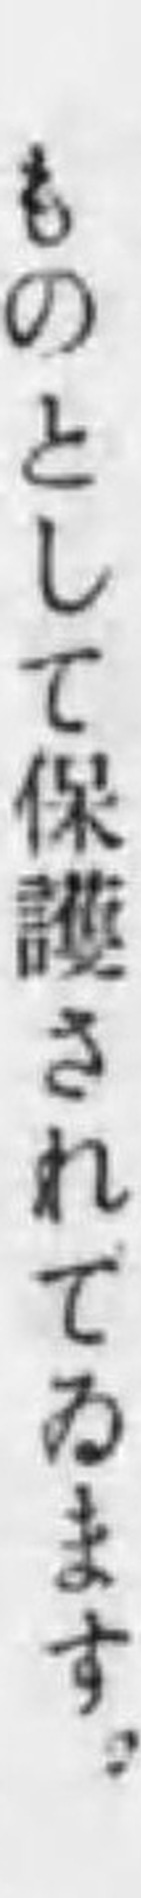ものとして保護されてゐます。
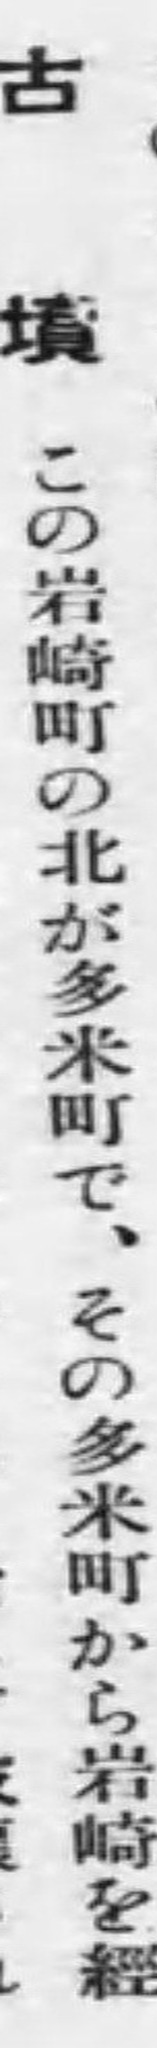古墳この岩崎町の北が多米町で、その多米町から岩崎を経
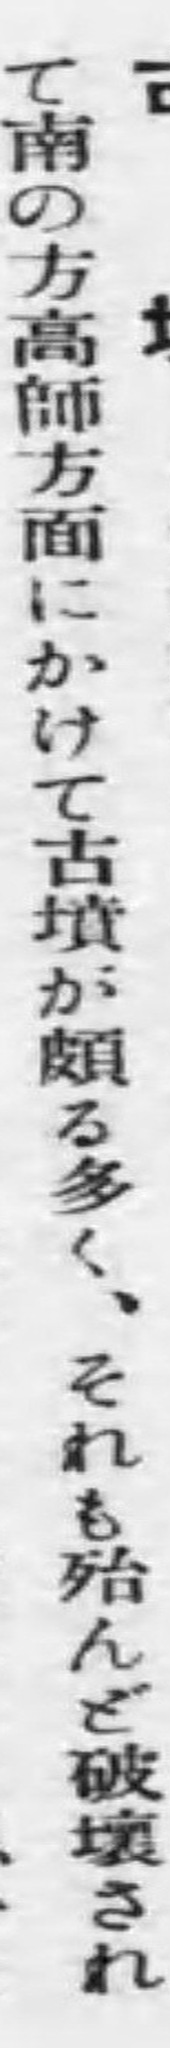て南の方高師方面にかけて古墳が頗る多く、それも殆んど破壊され
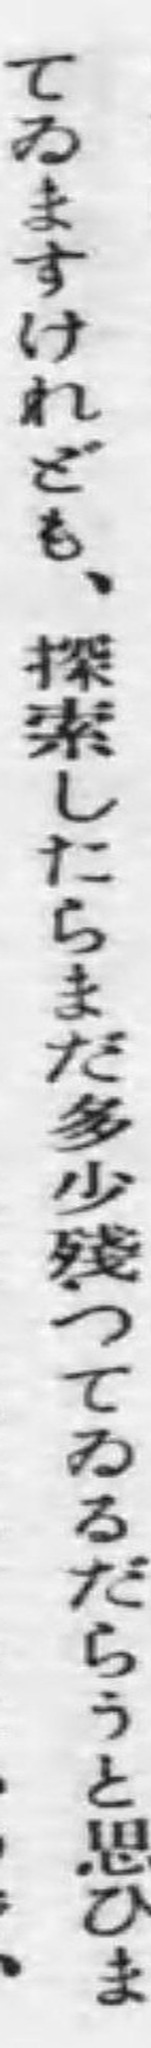てゐますけれども、探索したらまだ多少残つてゐるだらうと思ひま
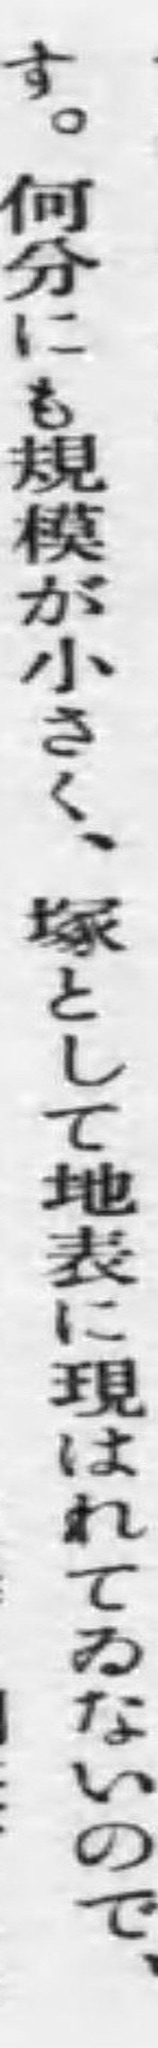す。何分にも規模が小さく、塚として地表に現はれてゐないので、
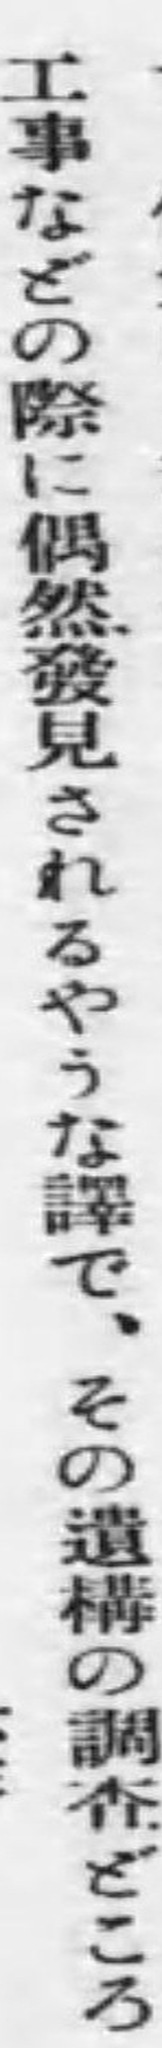工事などの際に偶然発見されるやうな訳で、その遺構の調査どころ

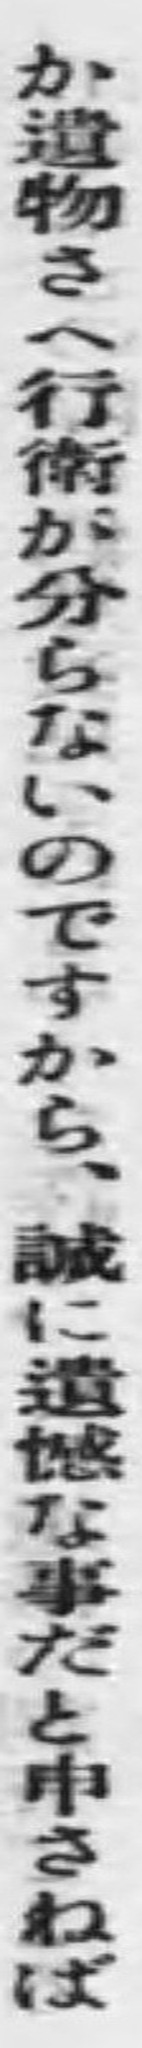か遺物さへ行衛が分らないのですから、誠に遺憾な事だと申さねば
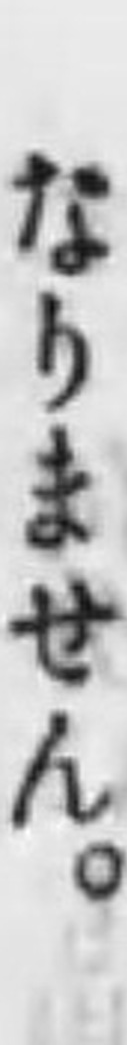なりません。
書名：東三河道中記 : 豊橋市及其附近案内
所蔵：国立国会図書館 National Diet Library, JAPAN
